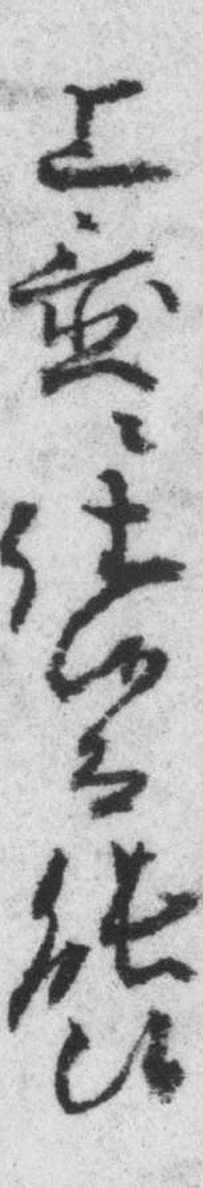上置に仕候て能候
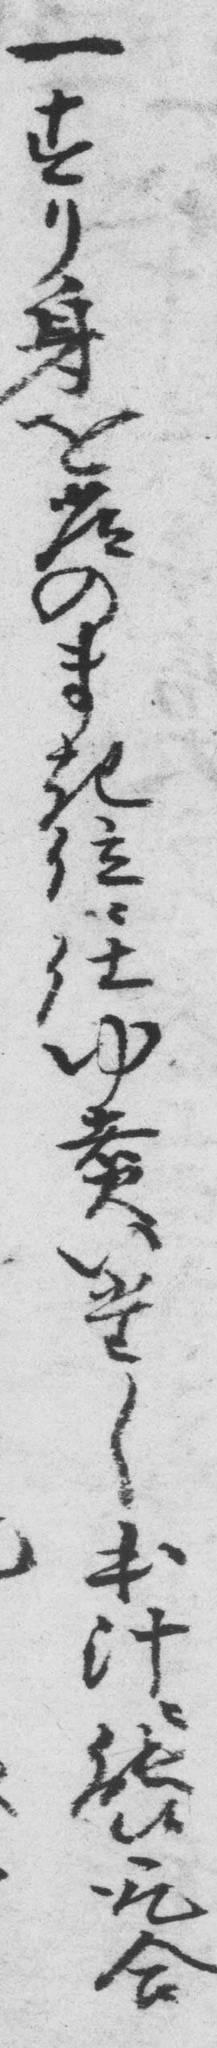一すり身を常のまき位に仕ゆ煮いたし本汁に能候取合
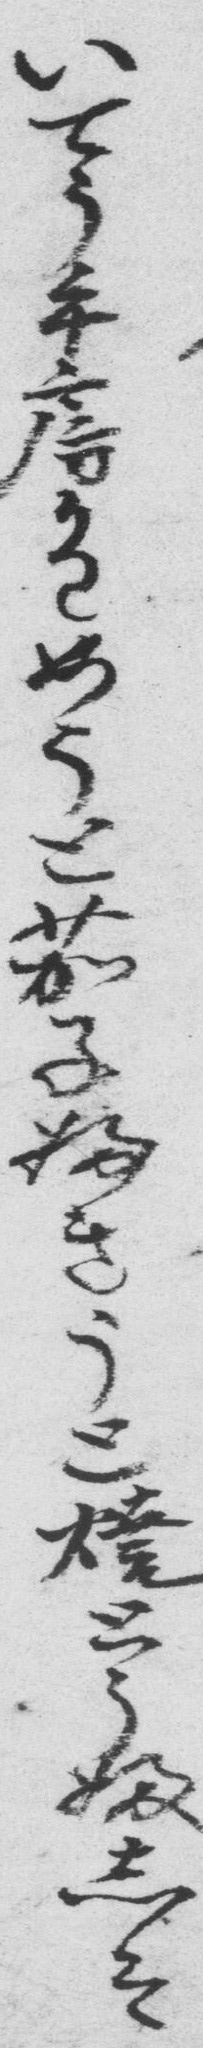いてう牛房かわめうと茄子ふきうと焼とうふしそ
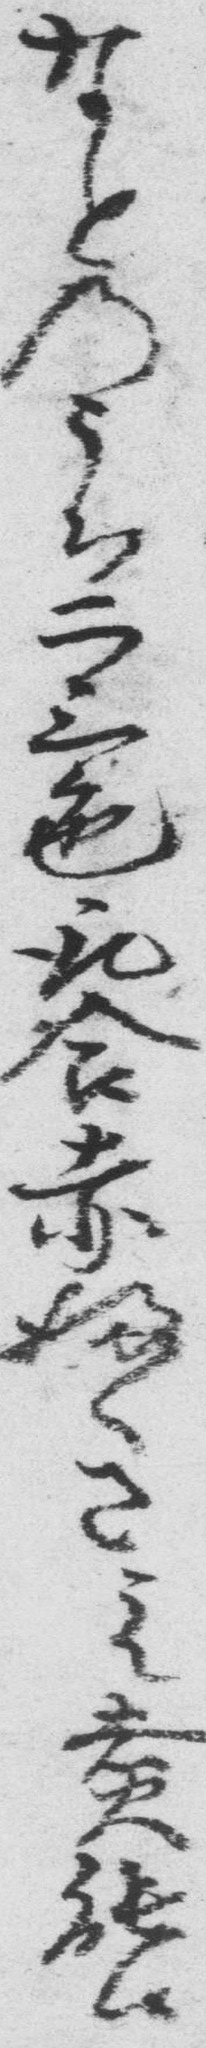なとのうち二三色取合赤ふくさにて煮能候
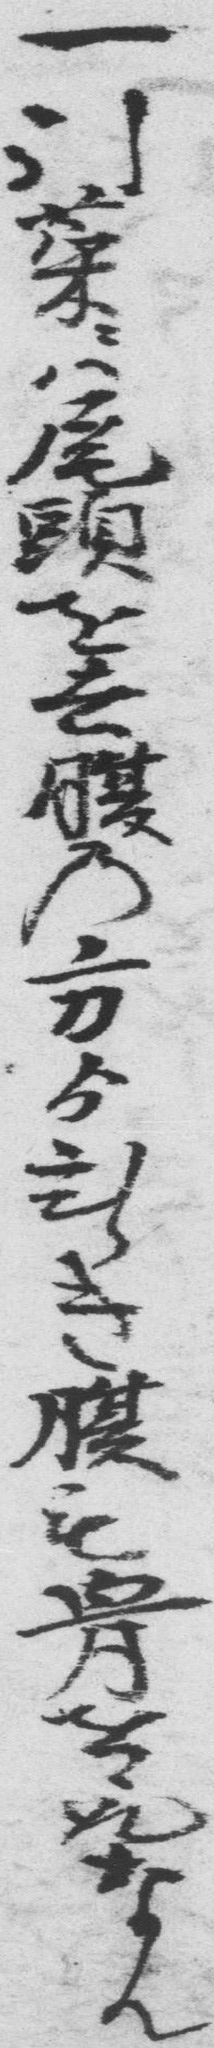一引菜には尾頭を去腹の方ゟひらき腹も骨を取なん
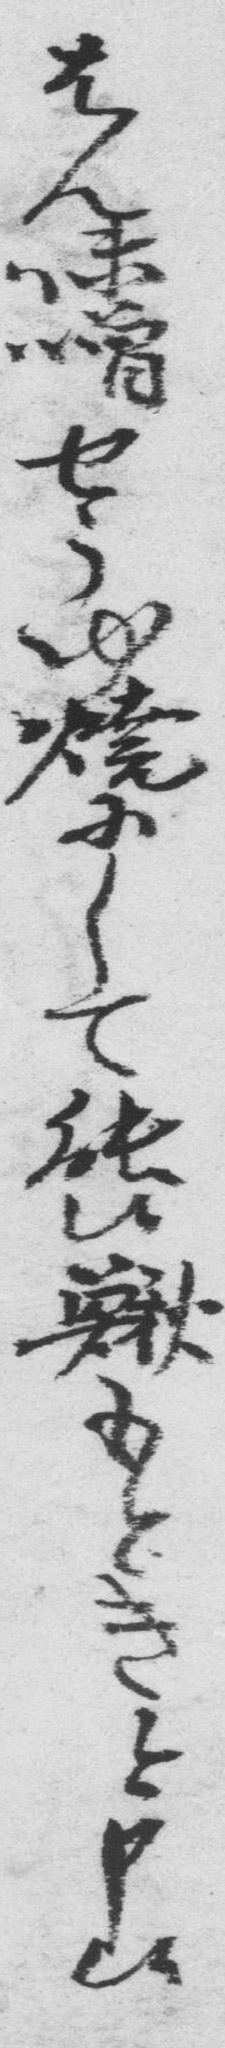はん味噌せうゆ焼にして能候鰍もときと申候
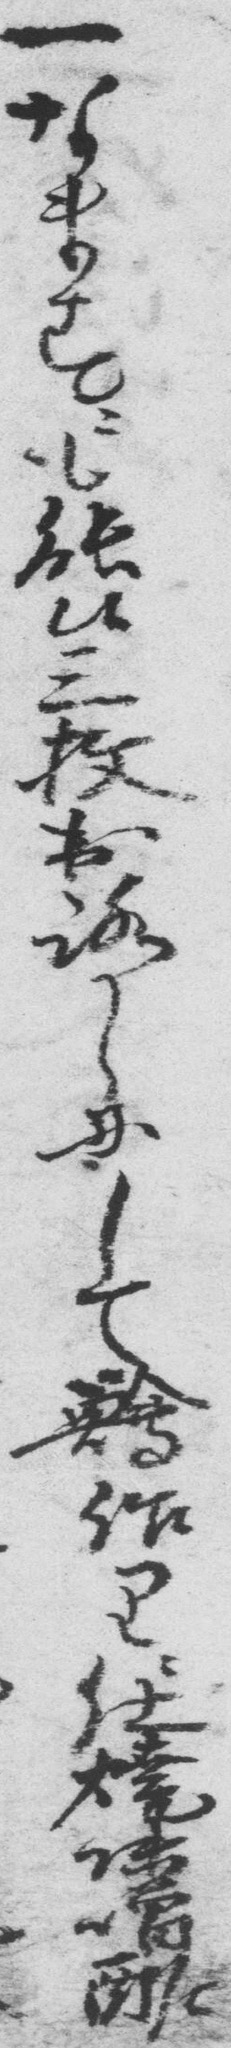一なますにも能候三枚おろしにして鱠作りに仕焼味噌酢
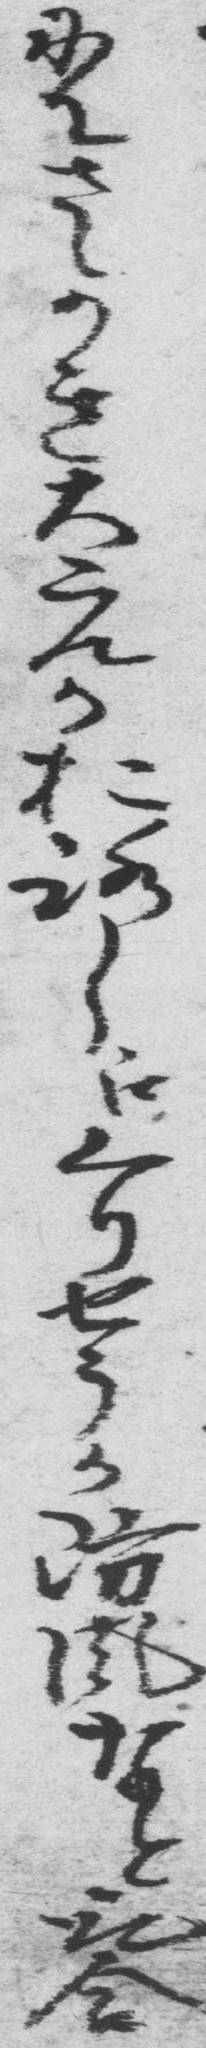にてさゝかき大こんかおろしえくりせうか防風なと取合

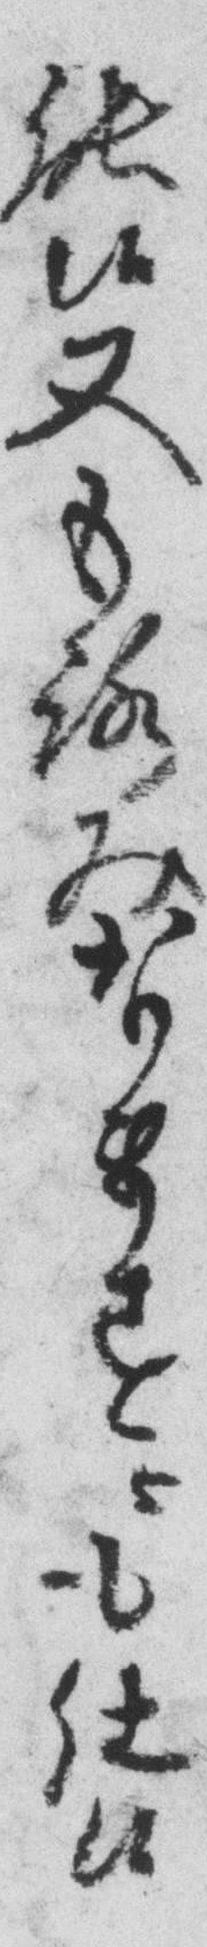能候又もろみなますにも仕候
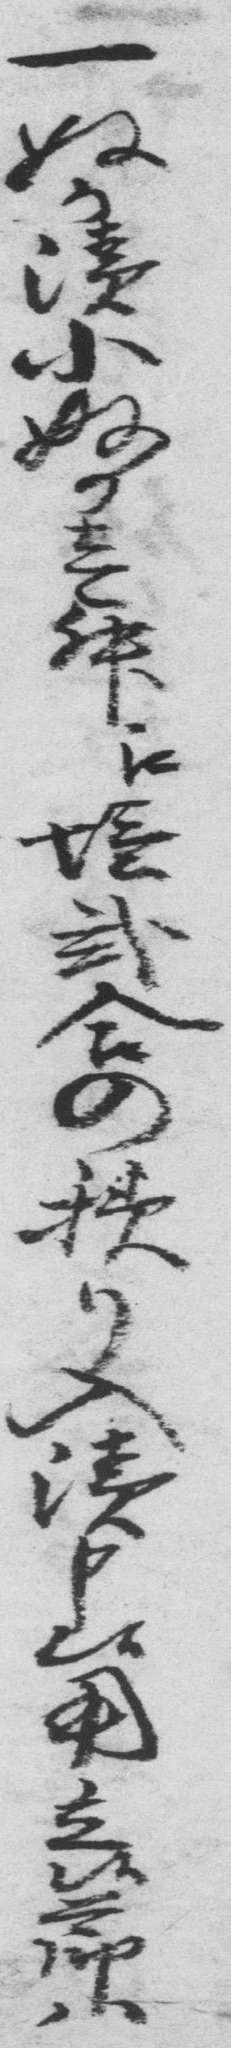一ぬか漬小ぬか一升え塩二合の積り入漬申候用立候節は
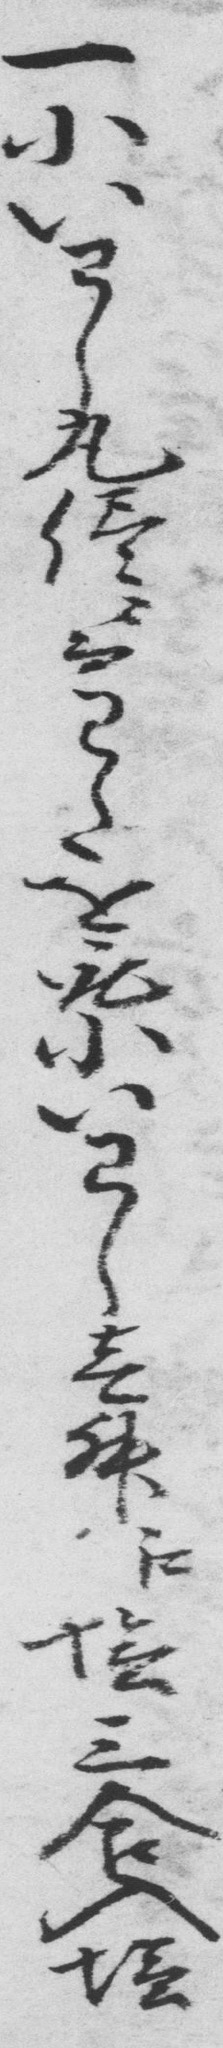一小いわし丸侭にてわたを取小いわし一升え塩三合入塩
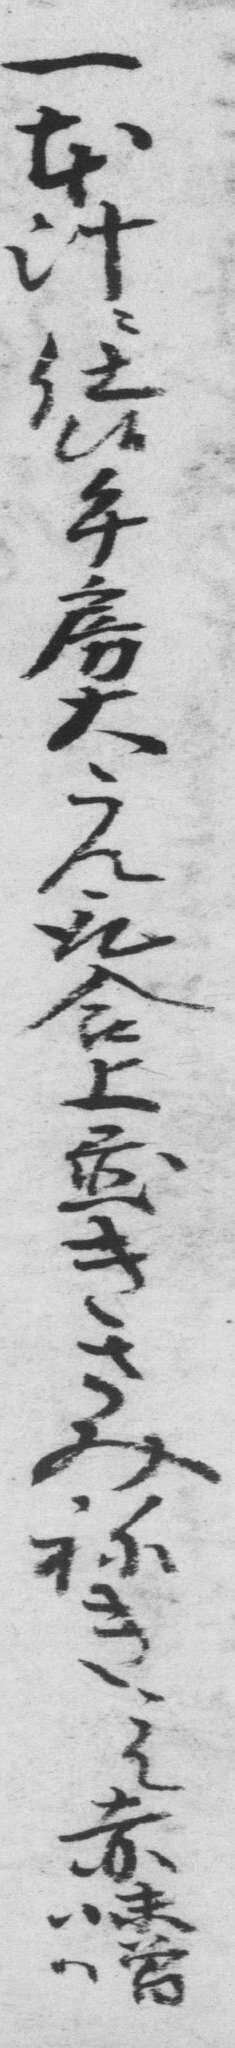一本汁に仕候牛房大こん取合上置きさみねきにて赤味噌
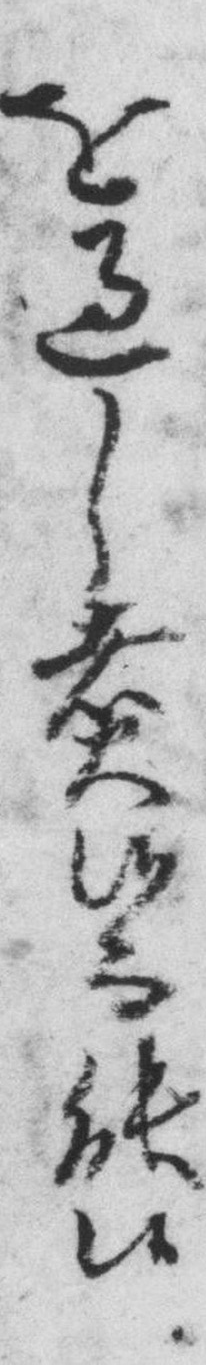を過し煮候て能候
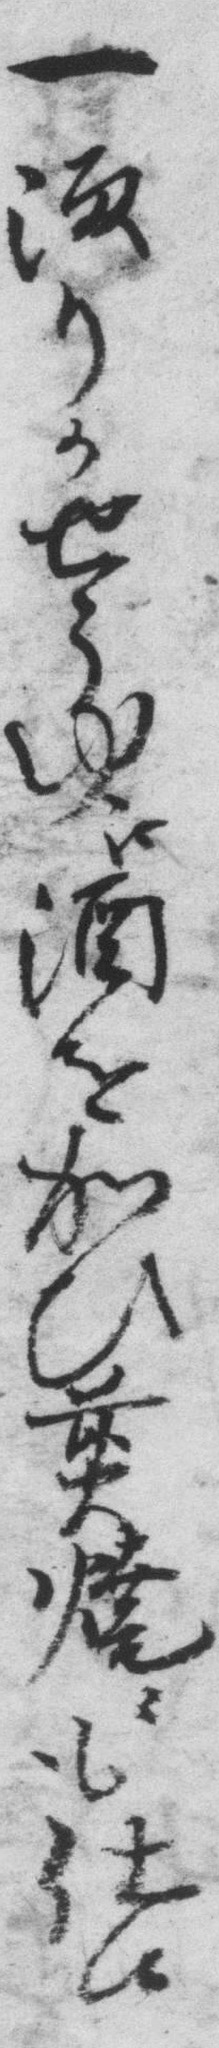一溜りかせうゆえ酒を加ひ煎焼にも仕候
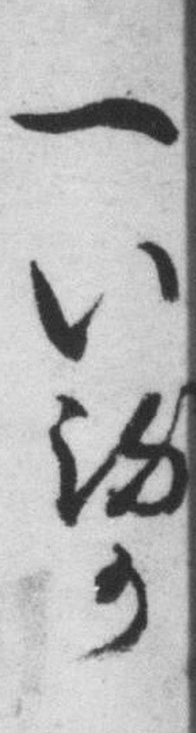一いるか
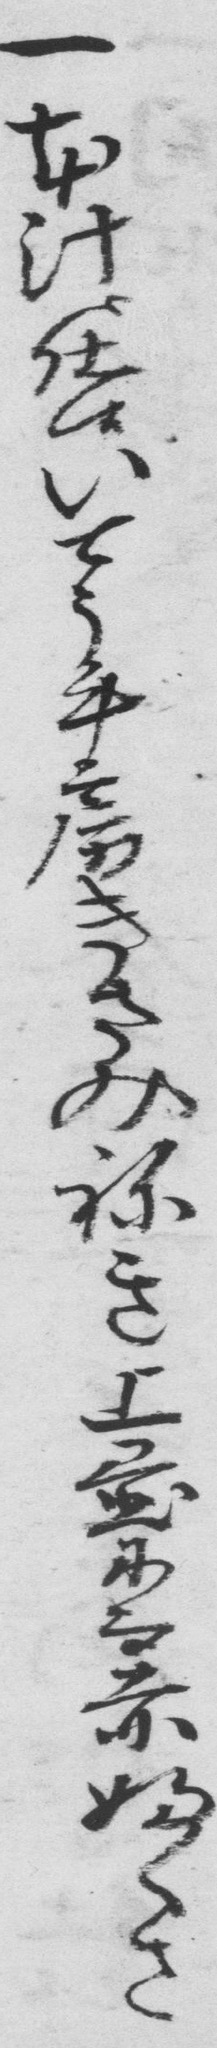一本汁に仕候いてう牛房きさみねき上置にて赤ふくさ
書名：料理集
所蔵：大阪府立大学学術情報センター 国文学研究資料館
